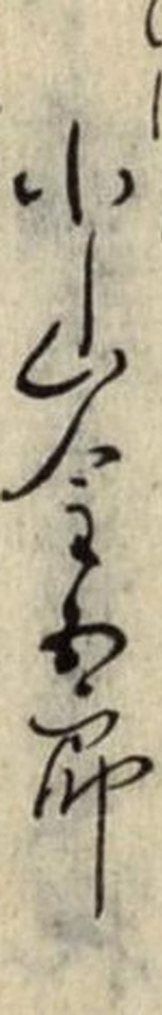小山金五郎
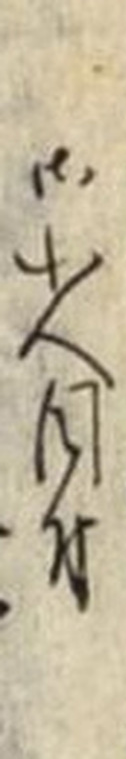御小人目付
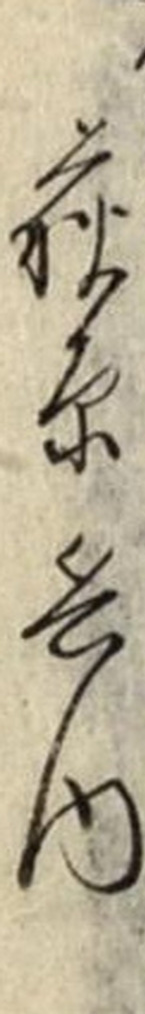萩原兵内
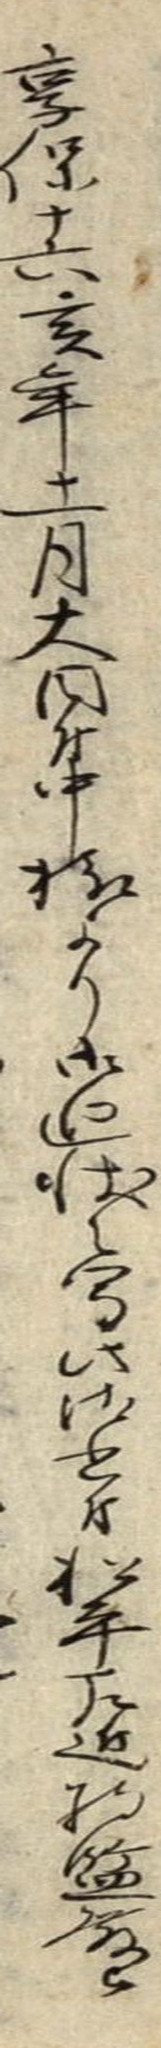享保十六亥年十一月大目付中様より御廻状之写此御書付松平左近将監殿被
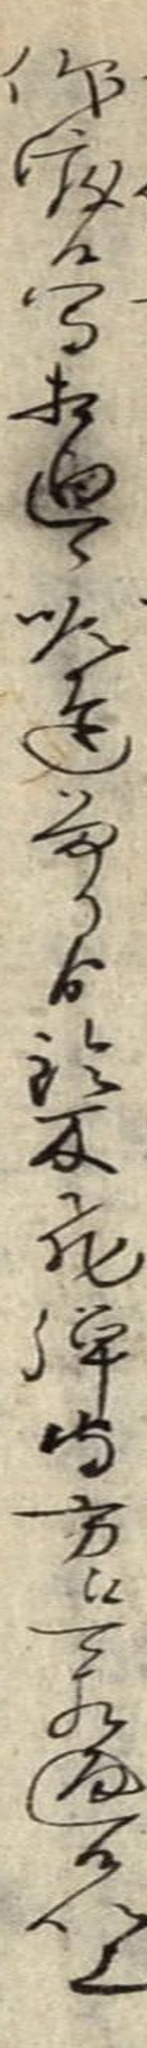仰渡候写相廻候順達留りゟ鈴木飛騨守方江可相通候以上
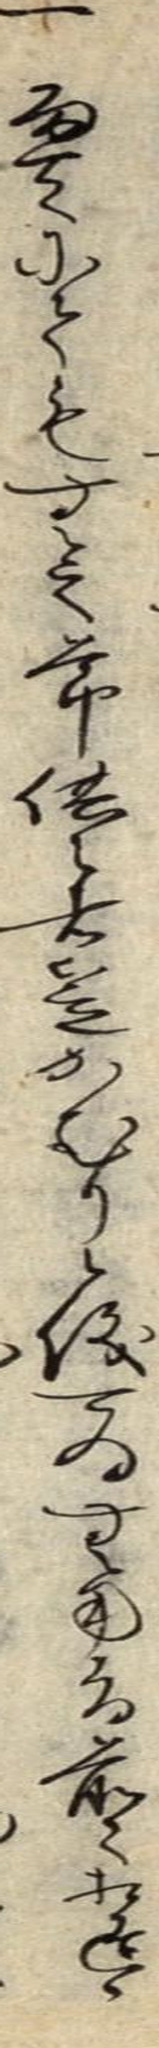一雨天にても無之節供之者笠かむり候儀可為無用旨前々相達候
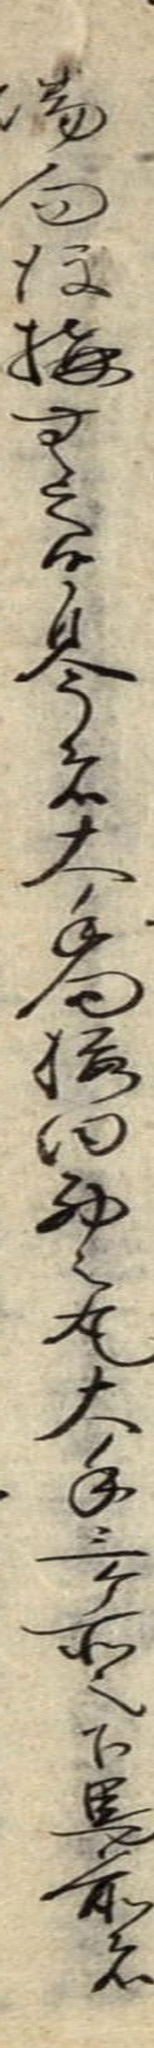場向後構無之候自今は大手向桜田西之丸大手三ケ所之下馬前は
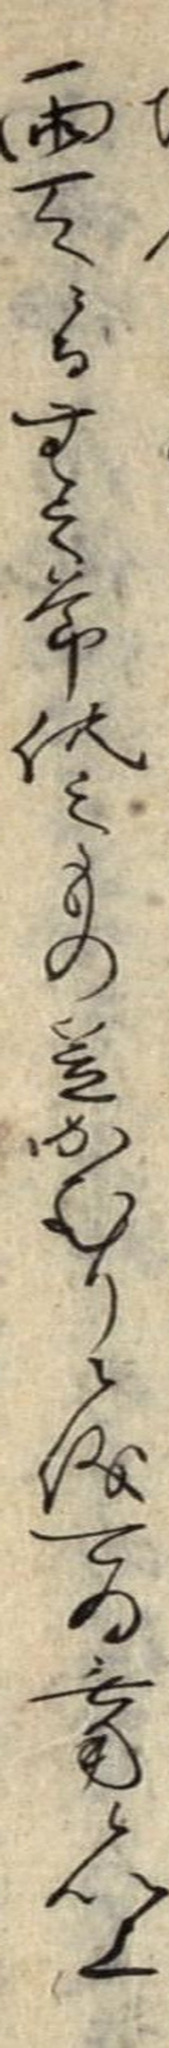雨天にて無之節供之者笠かむり候儀可為無用候以上

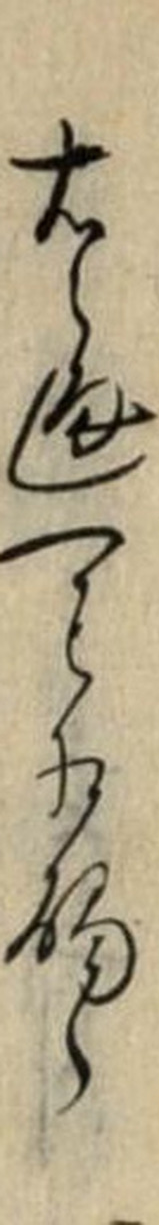右之通可被相触候
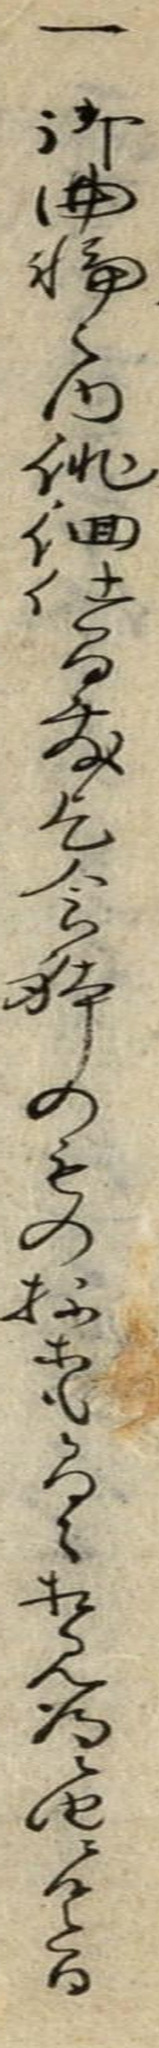一御曲輪之内徘徊仕間敷乞食体のもの抔等も間々相見え候由に候間
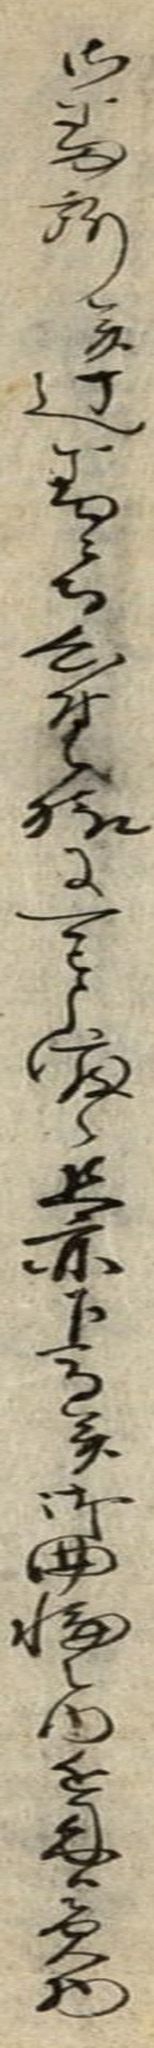御番所幷辻番にて心付候様に可被申渡候且又下馬幷御曲輪之内近来は売物
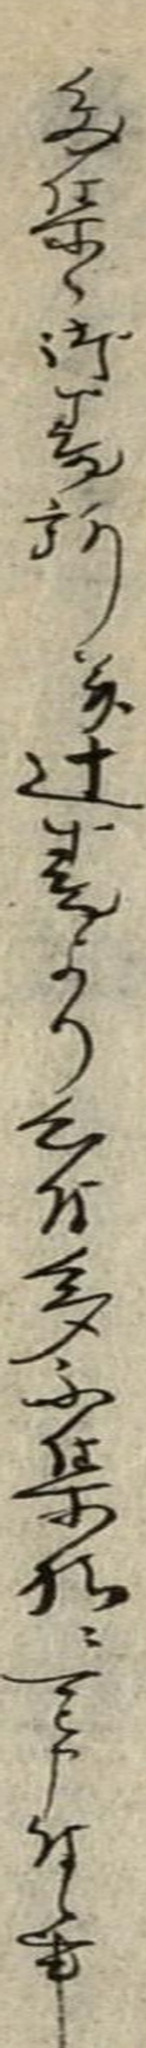寄集候御番所幷辻番より心付多不集様に可被申付候事
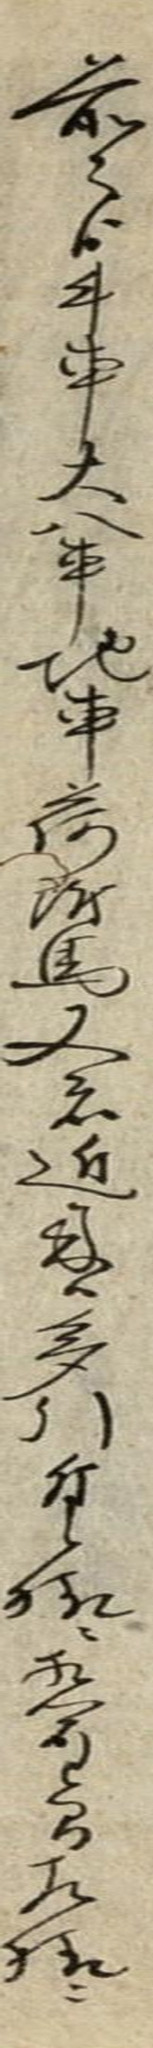前々ゟ手車大八車地車荷附馬又者近来は多引付候様に相聞候間左様に
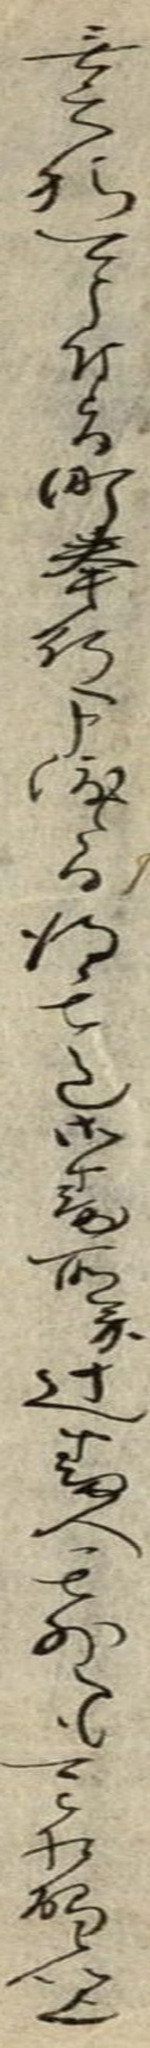無之様可申付旨町奉行へ申渡候間得其意御番所幷辻番人其外へも可被相触候以上
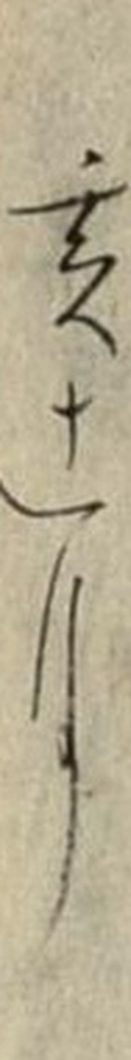亥十一月
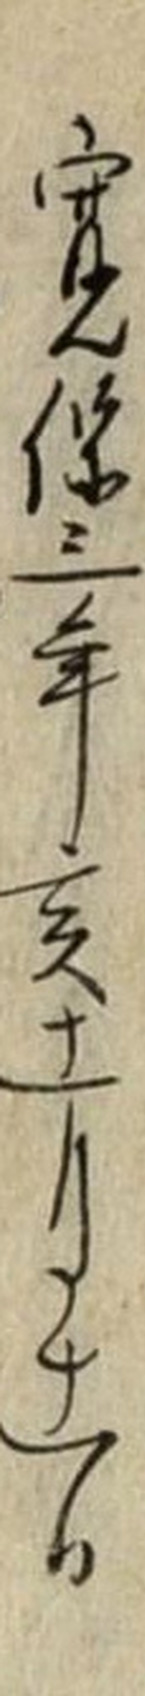寛保三年亥十一月十一日
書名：三都并道中之部
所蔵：福井県文書館 Fukui Prefectural Archives
